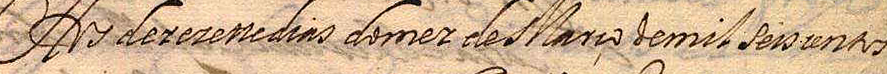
Aos dezezette dias do mez de Março de mil seiscentos
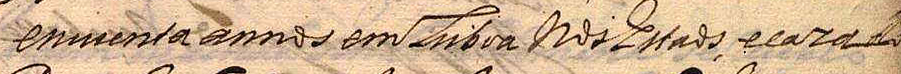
e nuuenta annos em Lisboa nos Estaos, e caza do
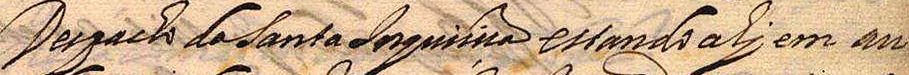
Despacho da Santa Inquisiçaõ estando ahj em au
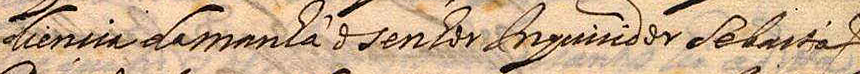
diençia da manhã o senhor Inquisidor Sebastiaõ
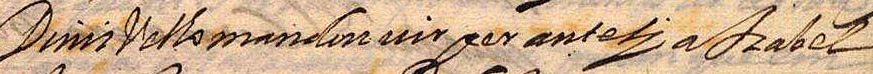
Dinis Velho mandou uir perante sj a Izabel
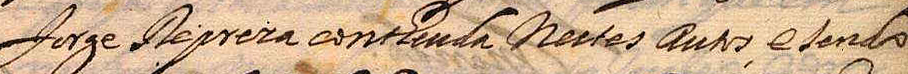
Jorge Re preza contheuda nestes autos, e sendo
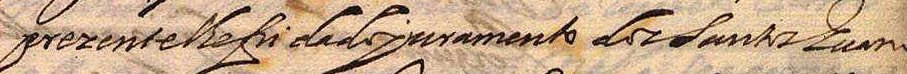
prezente lhe foi dado juramento dos Santos Euan
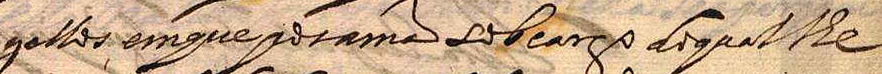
gelhos, em que pos a maõ sob cargo do qual lhe
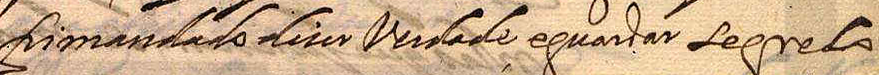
foi mandado diser Verdade, e guardar segredo
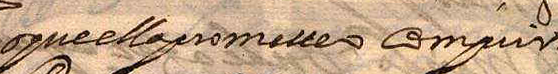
o que ella prometteo comprir.
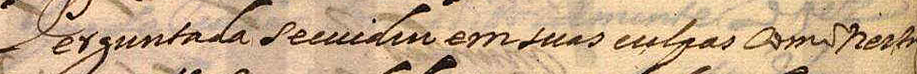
Perguntada se cuidou em suas culpas como nesta
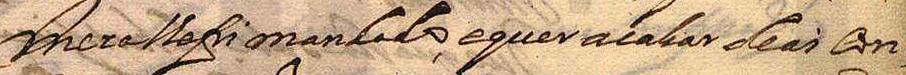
meza lhe foi mandado, e quer acabar de as con
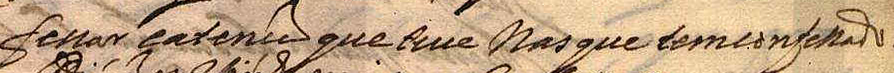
fessar, e a tençaõ que teue nas que tem confessado?
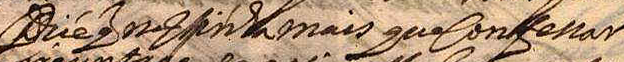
Dise q̄ naõ tinha mais que Confessar.
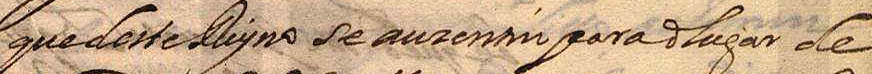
que deste Reyno se auzentou para o lugar de
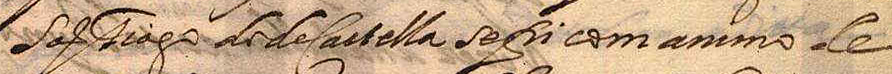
Saõ Tiago do de Castella se foi com animo de
